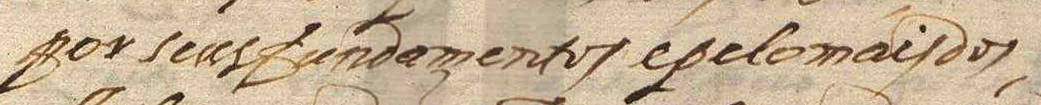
por seus fundamentos e pelo mais dos
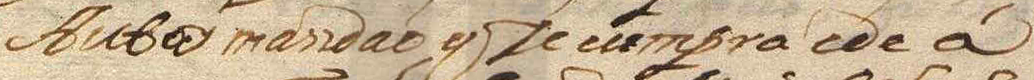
Autos mandaõ q̄ se cumpra e de a
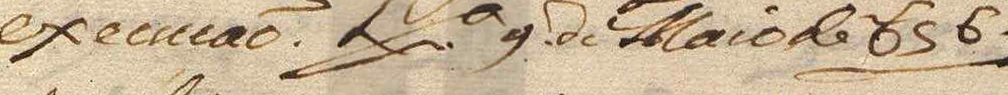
execuçaõ. Lx.a 9 de Maio de 656.
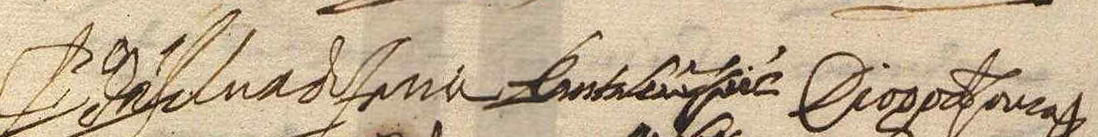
Po da Silua de faria Pantaleão Roiz̄ Diogo d Souza
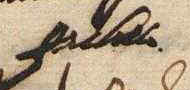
pacheco.
